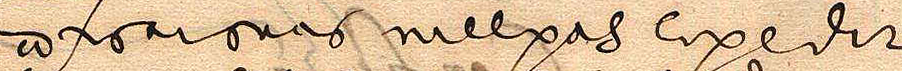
co̅fesar suas cullpas e pedir
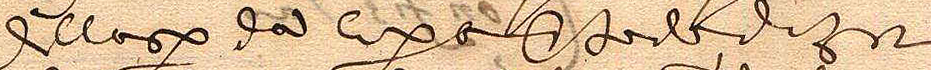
dellas ꝑ da̅ E ꝑa e̅ todo dizer
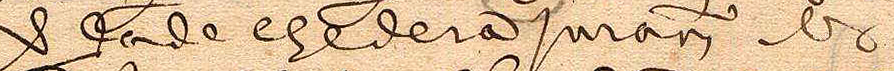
ꝟdade lhe dera̅ juramto dos
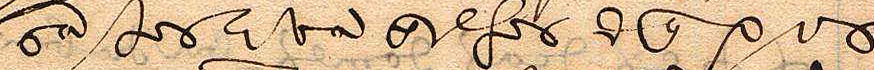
sa̅tos Eva̅gelhos e̅ q̅ pos
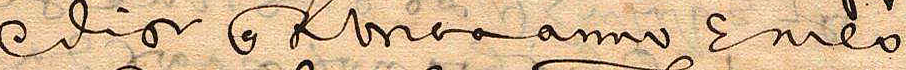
e dise q̅ averaa anno E meo
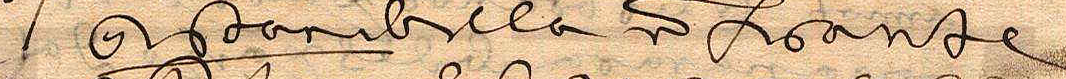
q̅ estando ella co̅fesante
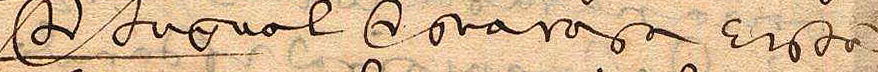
e̅ te̅tuguaL e̅ sua casa E esta̅
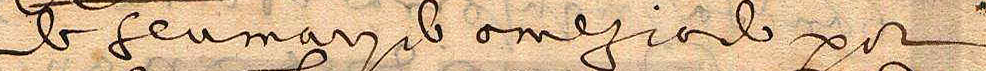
do seu marjdo omeziado por
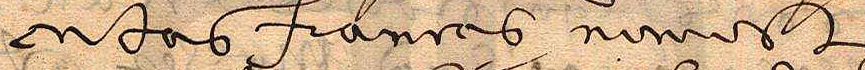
certas fianças no mostro
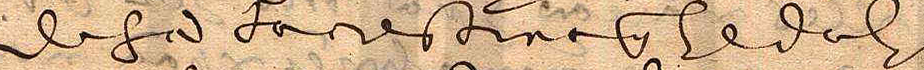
de sa̅ta crestina q̅ he dahj
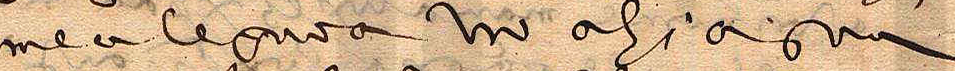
mea leguoa veo ahi a sua
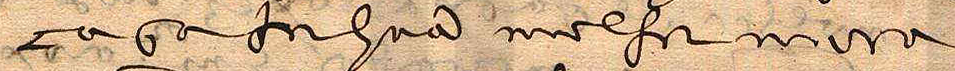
casa ter hu̅a molher mora
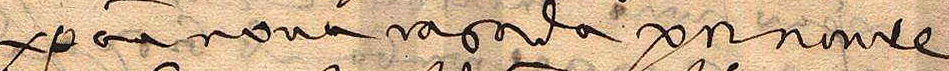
xpa̅a noua casada por nome
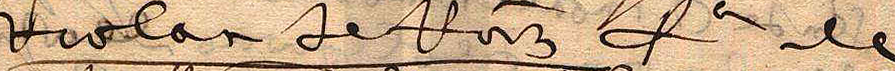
violante Ro̅iz fa de
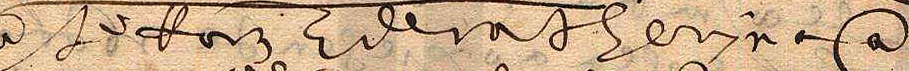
a̅to Ro̅iz E de catherjna a̅
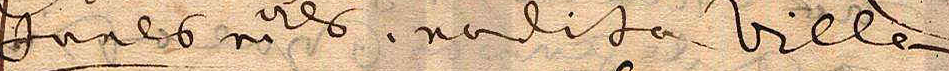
tunes mores. na dita villa
